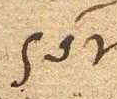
Sor̄
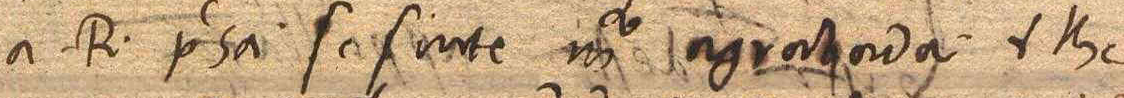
a .R. p̄sa se sente mto agravada ē lhe
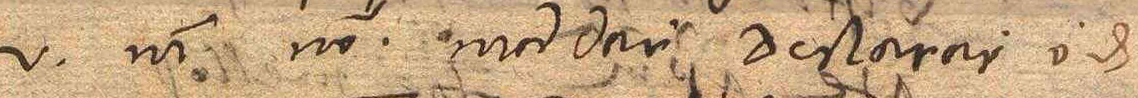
.v. m̄. nō. mādar declarar o dj.
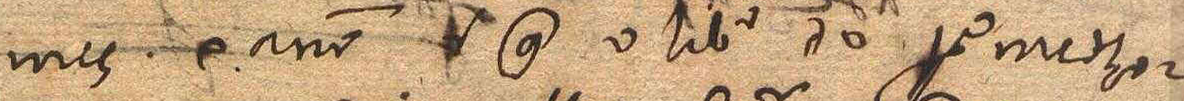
mes. e ano ē q̄ o libo do ꝓomethor
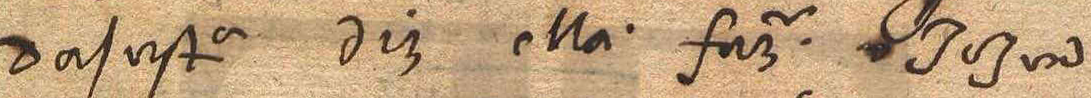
da Justa diz ella. faz̄. o JeJuū
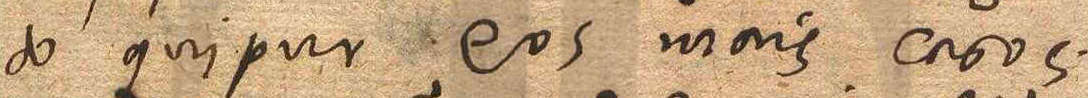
do qujpur e os mais casos.
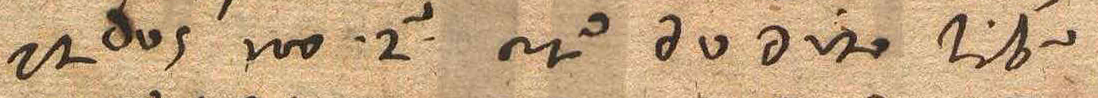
ꝯtdos no .2o. arto do dito Libo
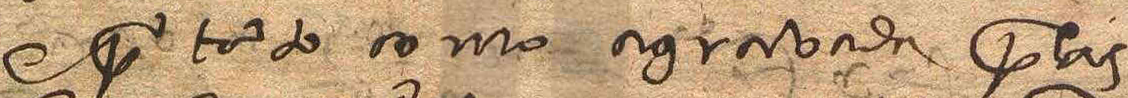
e p̄otāto como agravada p̄las
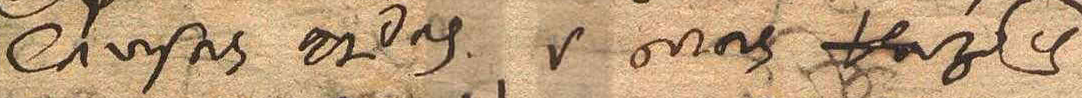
Causas ꝯtdas. ē suas Razoẽs
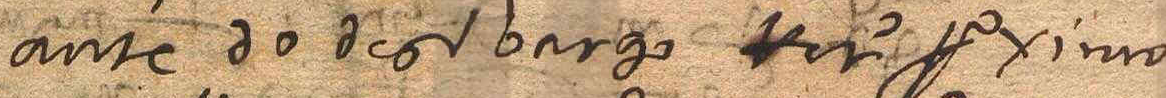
ante do desēbargo Reto ꝓoximo
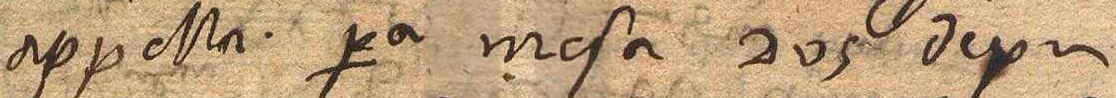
appella. ꝑa mesa dos depu
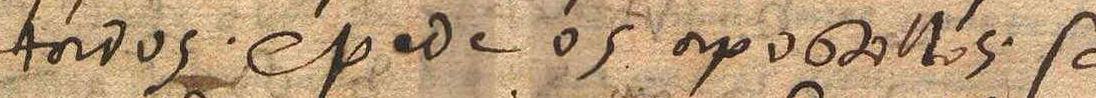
tados. e pede os apostollos. se
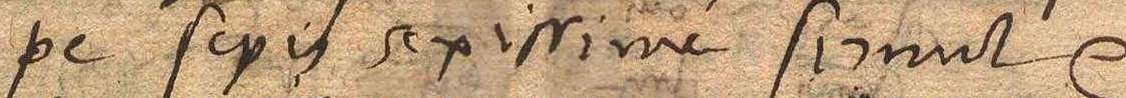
pe sepis sexissime simul e
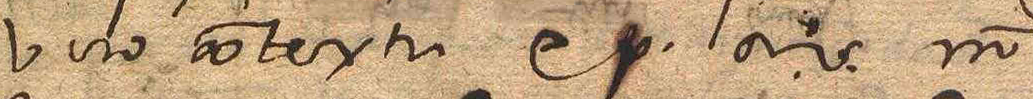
vero c̄otextu e p. a v. m̄
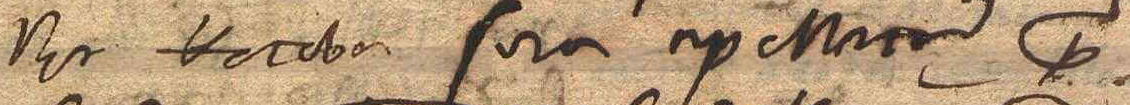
lhe Receba sua apellaçā p̄o
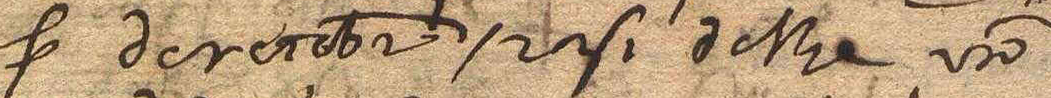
ꞩ de reçeb̄r / e asi de lhe nō
